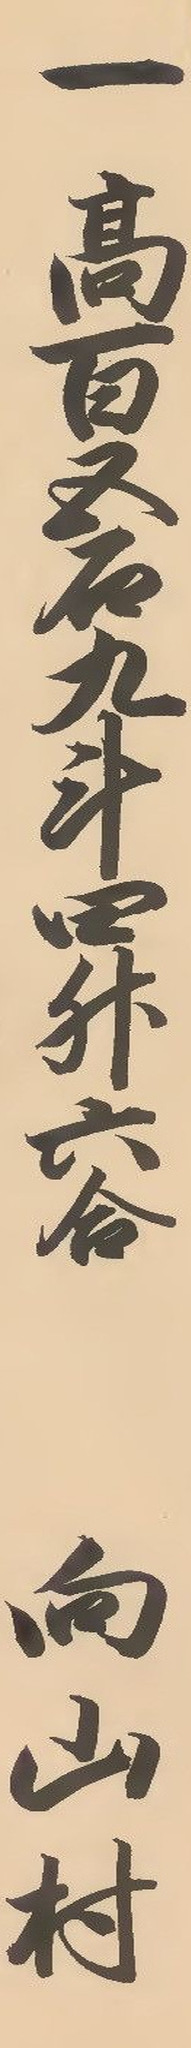一高百五石九斗四升六合向山村
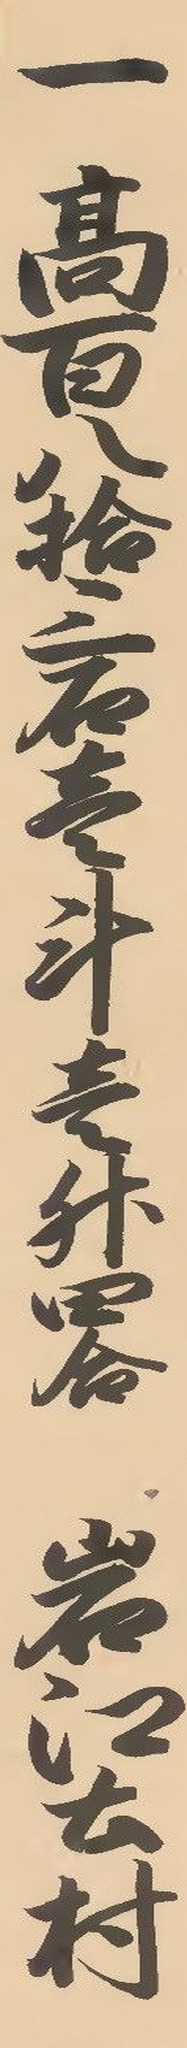一高百八拾三石壱斗壱升四合岩江土村
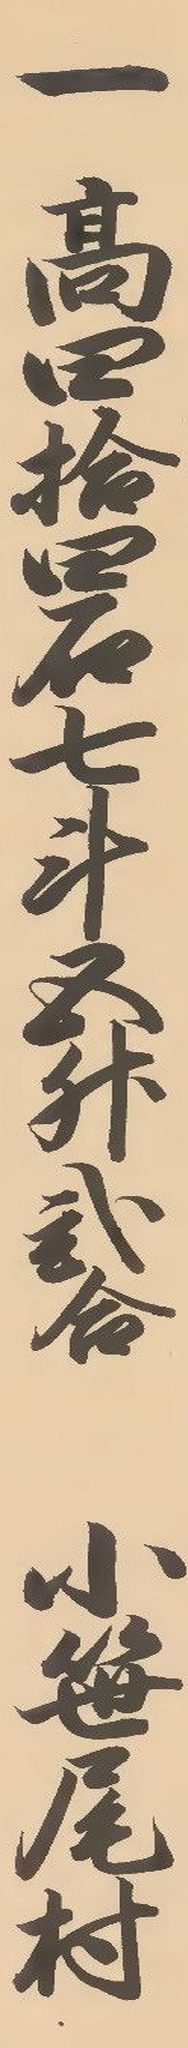一高四拾四石七斗五升弐合小笹尾村
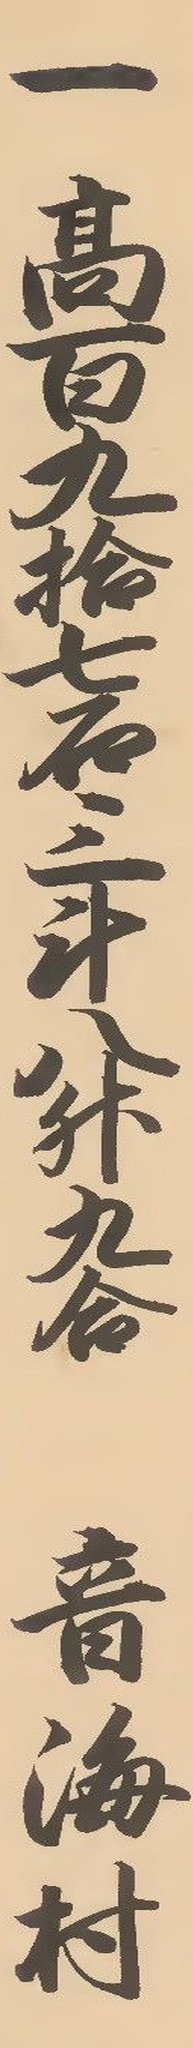一高百九拾七石三斗八升九合音海村

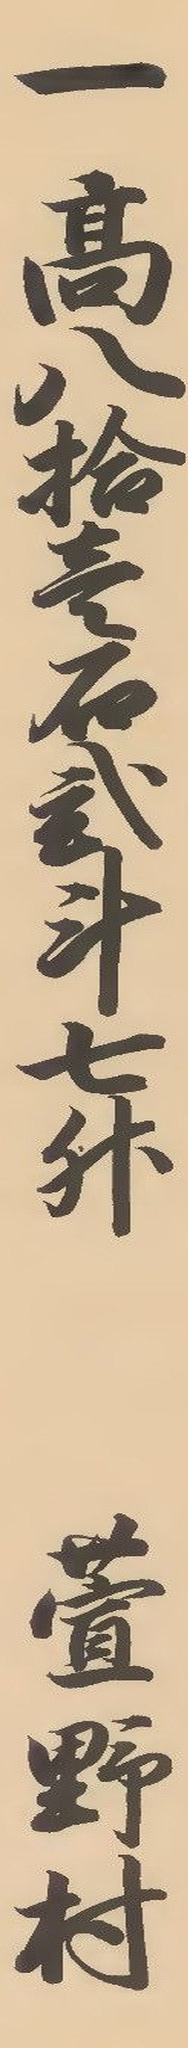一高八拾壱石弐斗七升萱野村
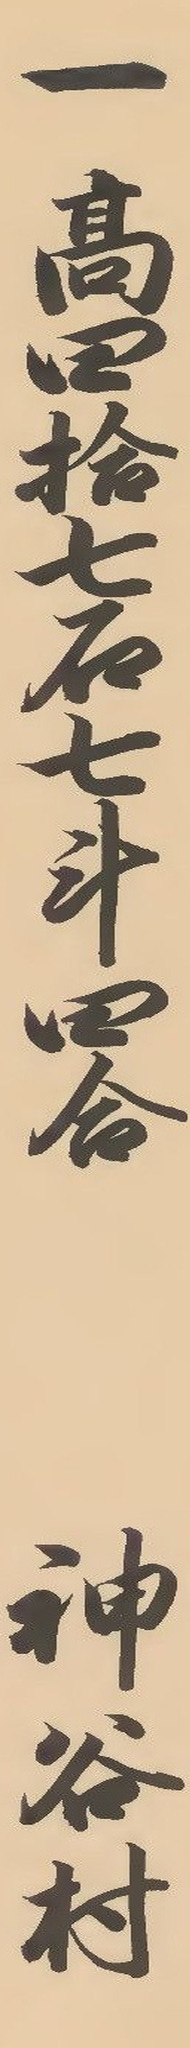一高四拾七石七斗四合神谷村
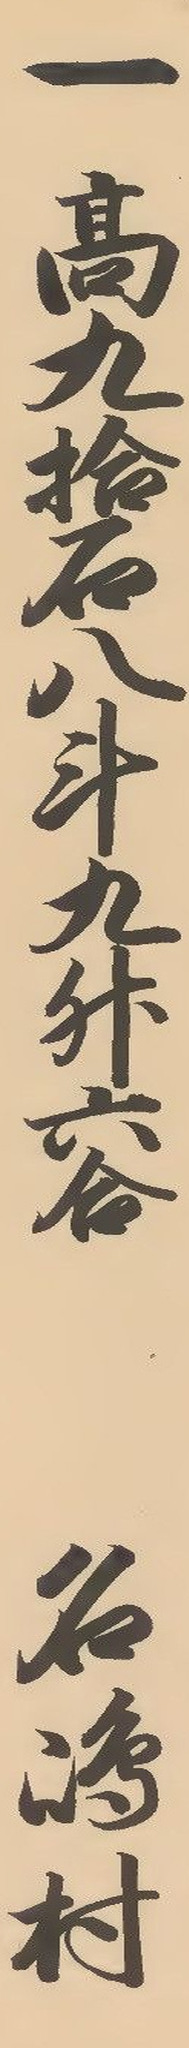一高九拾石八斗九升六合名島村
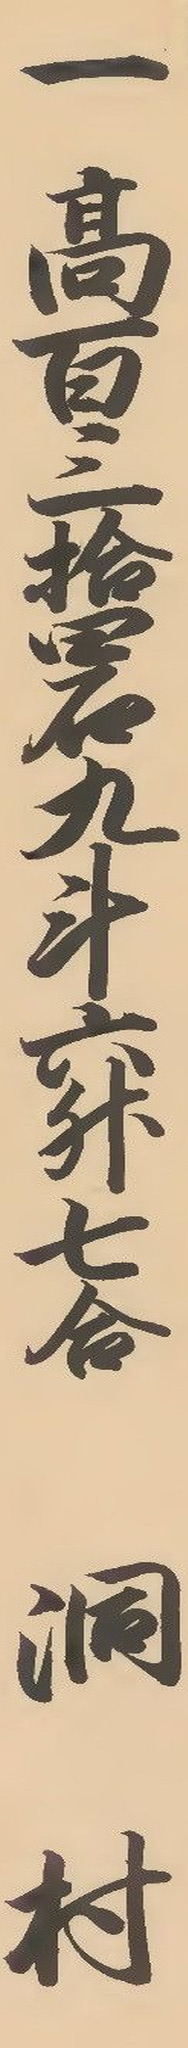一高百三拾四石九斗六升七合洞村
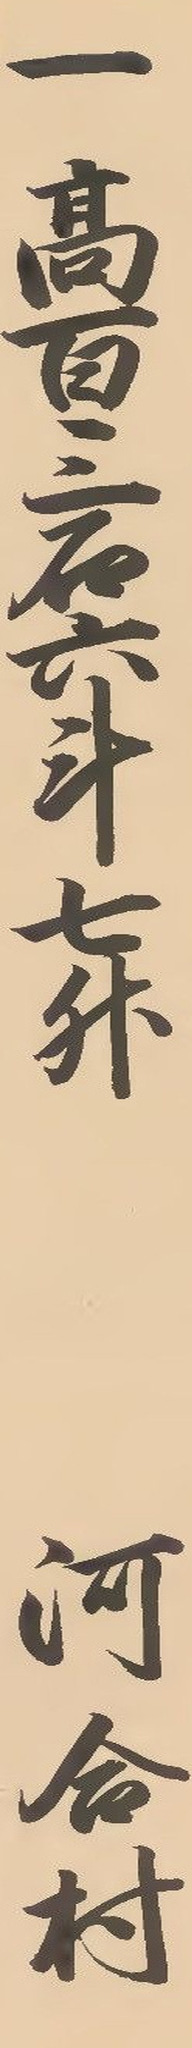一高百三石六斗七升河合村
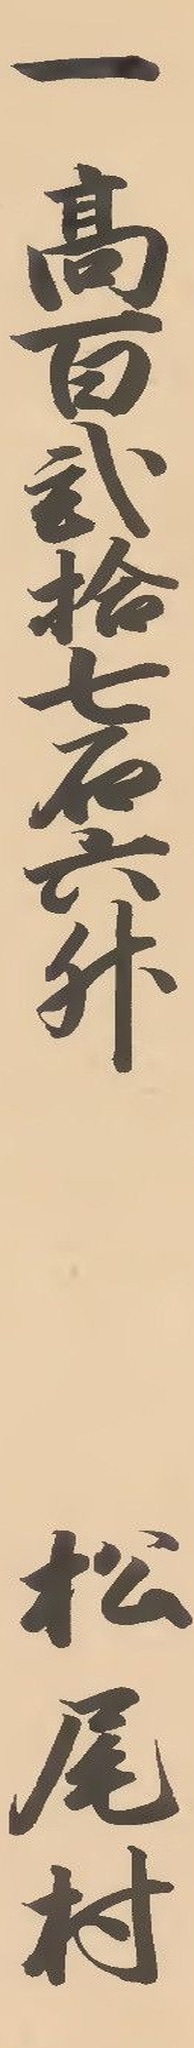一高百弐拾七石六升松尾村
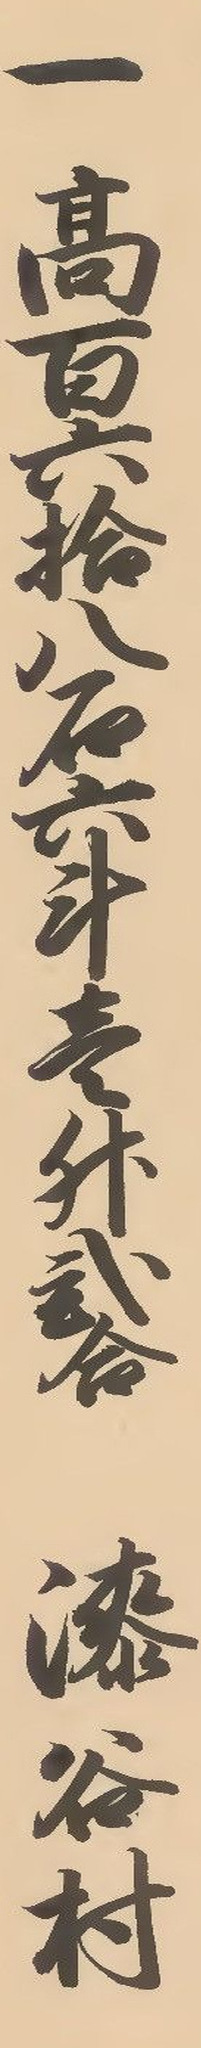一高百六拾八石六斗壱升弐合漆谷村

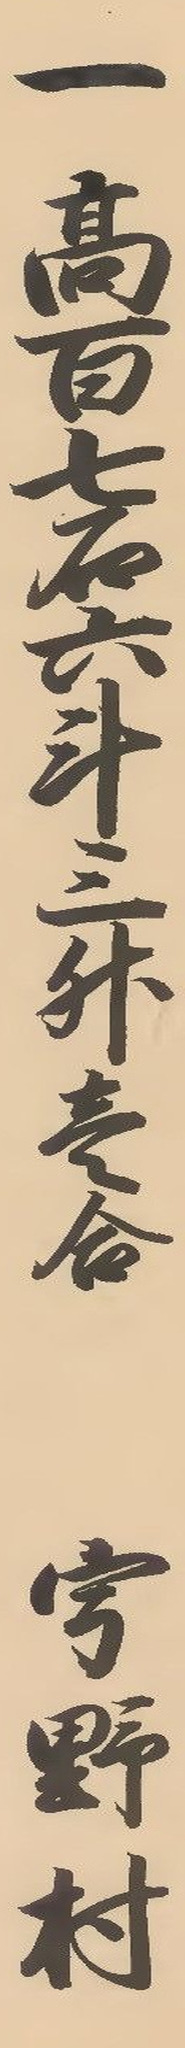一高百七石六斗三升壱合宇野村
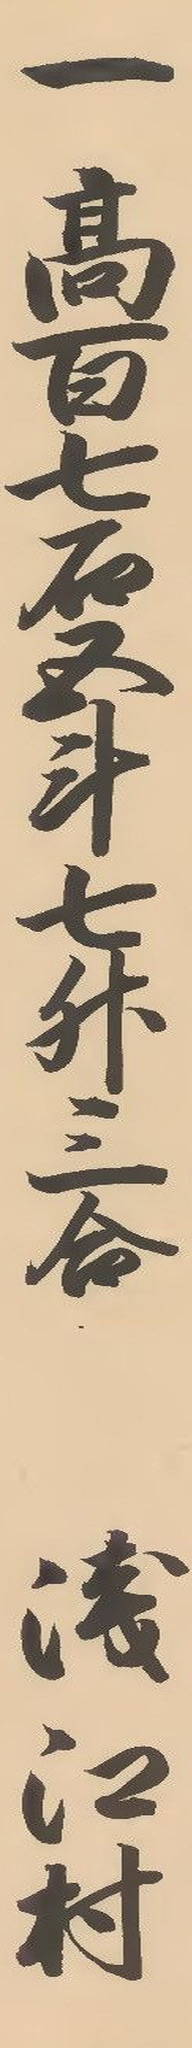一高百七石五斗七升三合浅江村
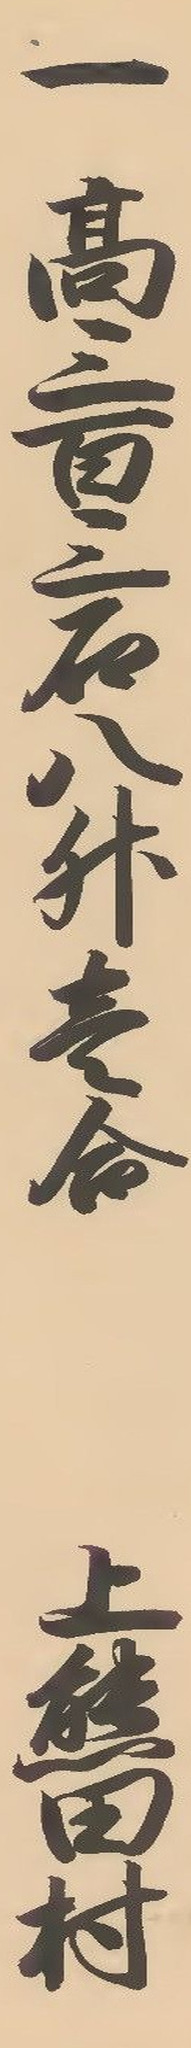一高三百三石八升壱合上熊田村
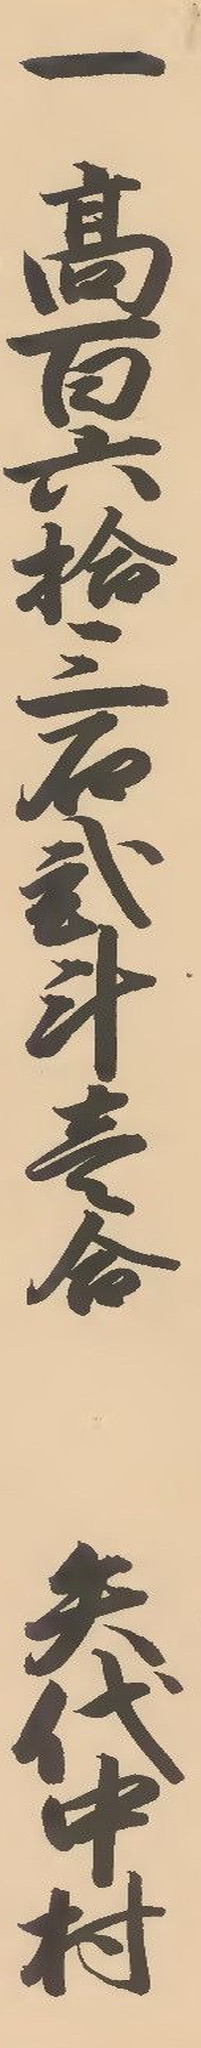一高百六拾三石弐斗壱合矢代中村
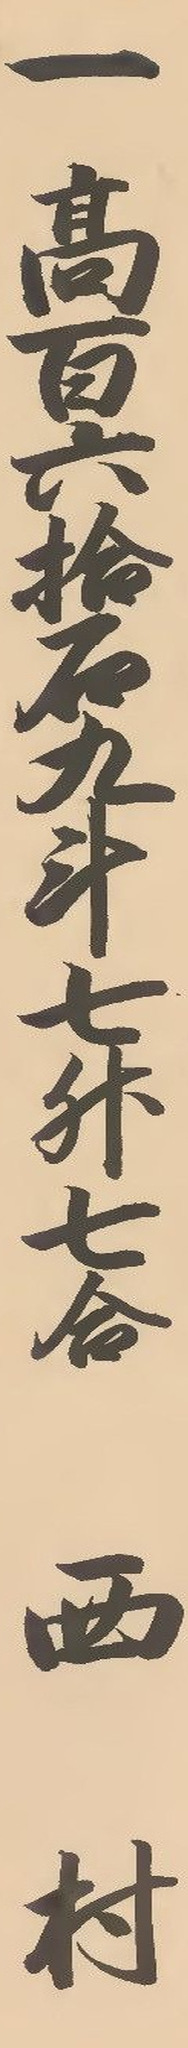一高百六拾石九斗七升七合西村
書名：丹波国郷帳
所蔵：国立公文書館 National Archives of Japan
